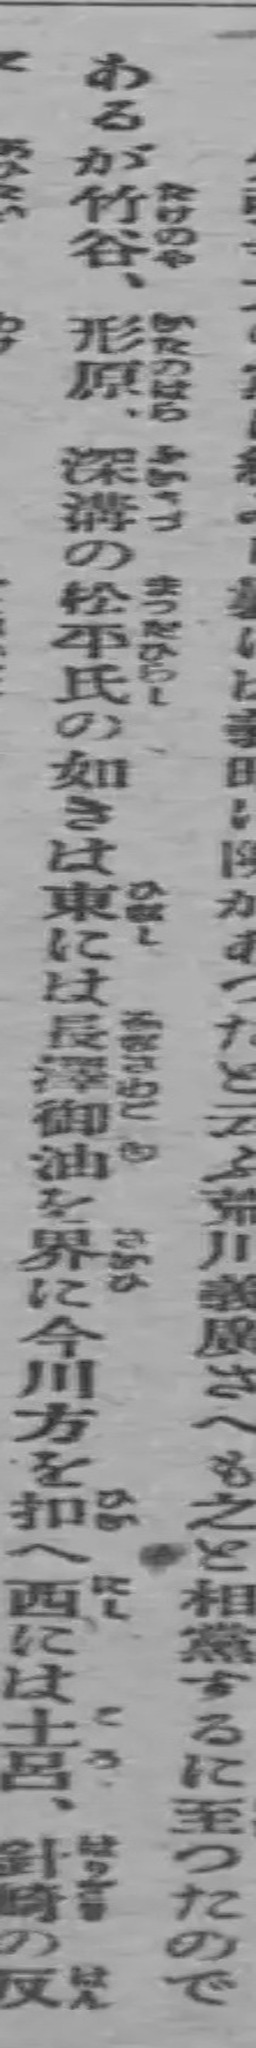あるが竹谷、形原、深溝の松平氏の如きは東には長沢御油を界に今川方を扣へ西には土呂、針崎の反
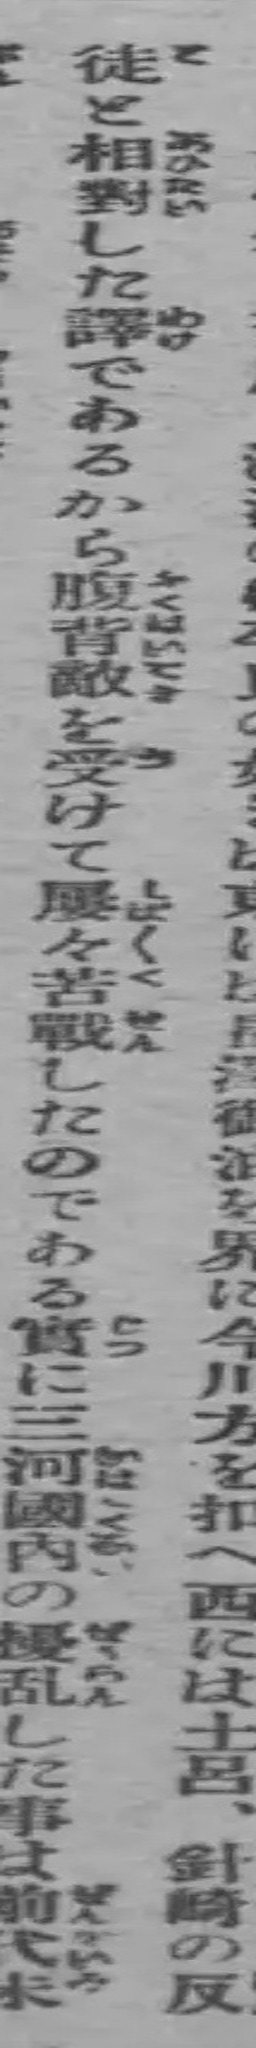徒と相対した訳であるから腹背敵を受けて屡々苦戦したのである実に三河国内の擾乱した事は前代未
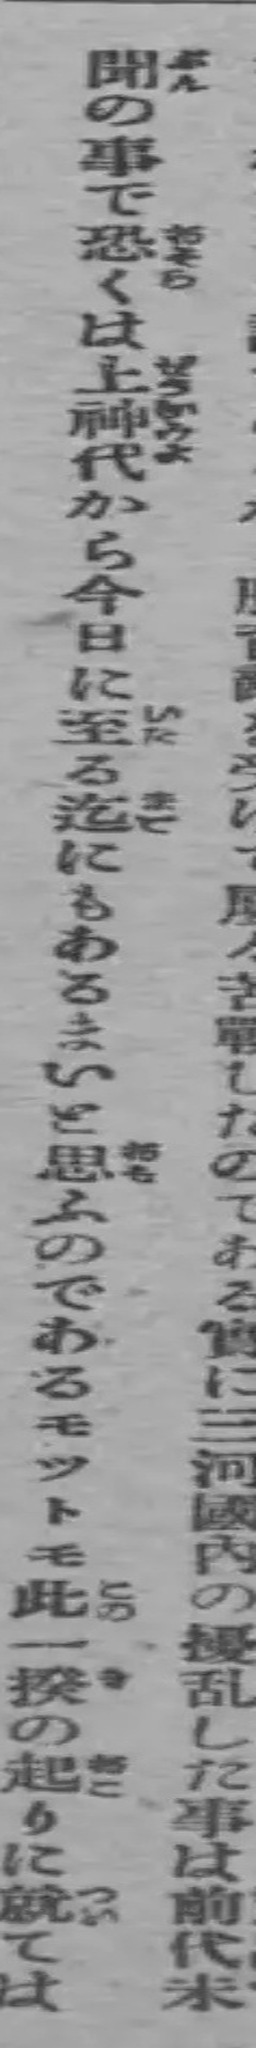聞の事で恐くは上神代から今日に至る迄にもあるまいと思ふのであるモツトモ此一揆の起りに就ては
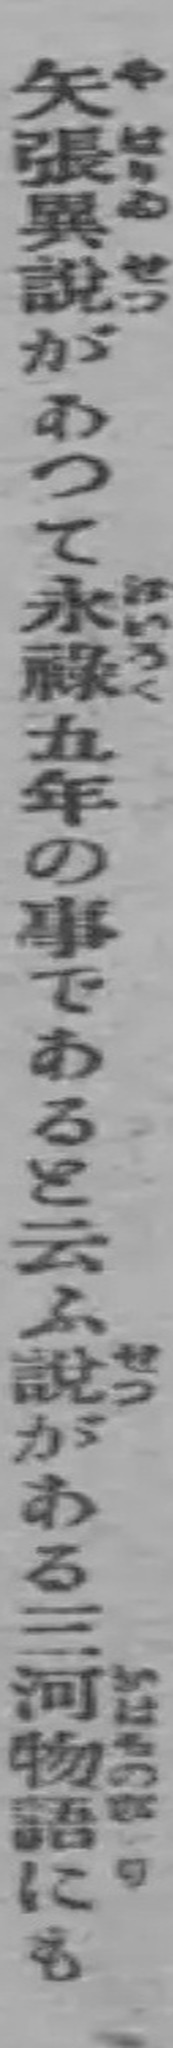矢張異説があつて永禄五年の事であると云ふ説がある三河物語にも
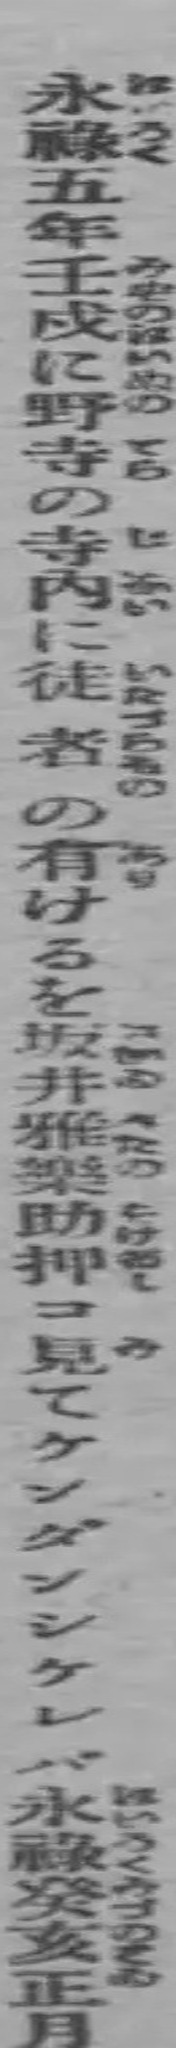永禄五年壬戌に野寺の寺内に徒者の有けるを坂井雅樂助押コ見てケンダンシケレバ永禄癸亥正月
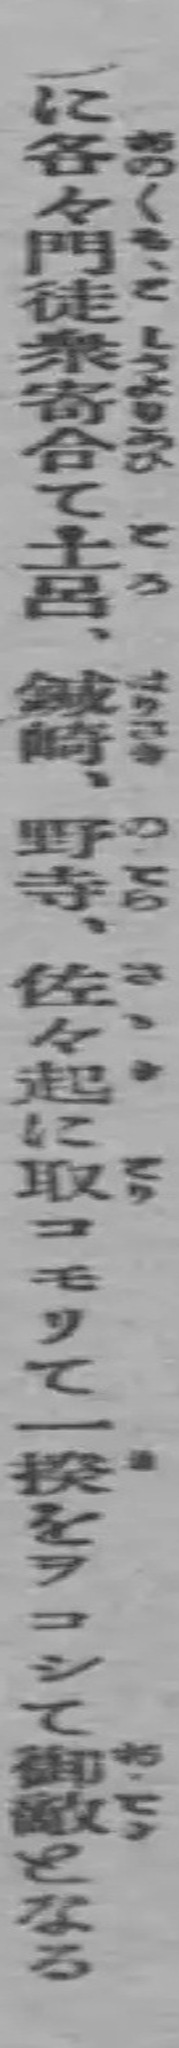に各々門徒衆寄合て土呂、鍼崎、野寺、佐々起に取コモリて一揆をヲコシて御敵となる
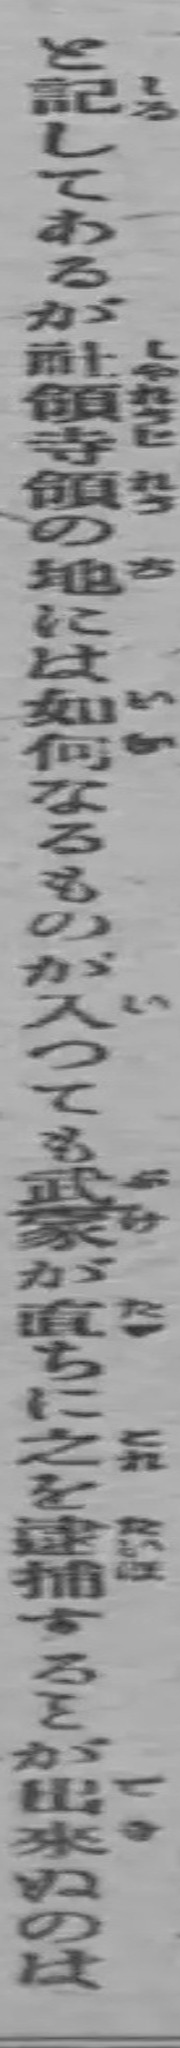と記してあるが社領寺領の地には如何なるものが入つても武家が直ちに之を逮捕することが出来ぬのは
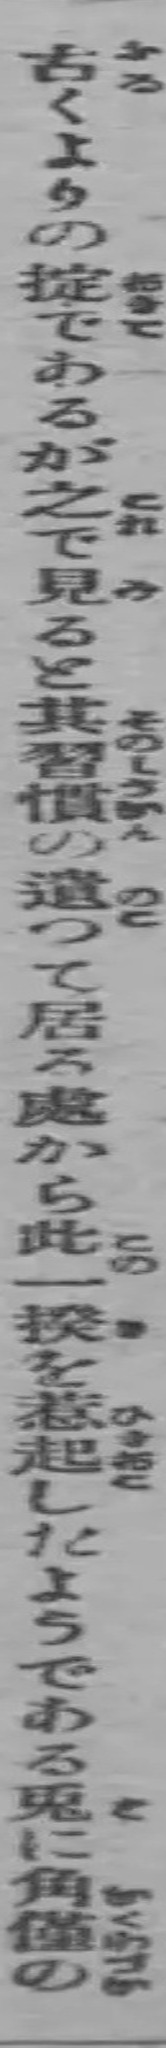古くよりの掟であるが之で見ると其習慣の遺つて居る処から此一揆を惹起したようである兎に角僅の
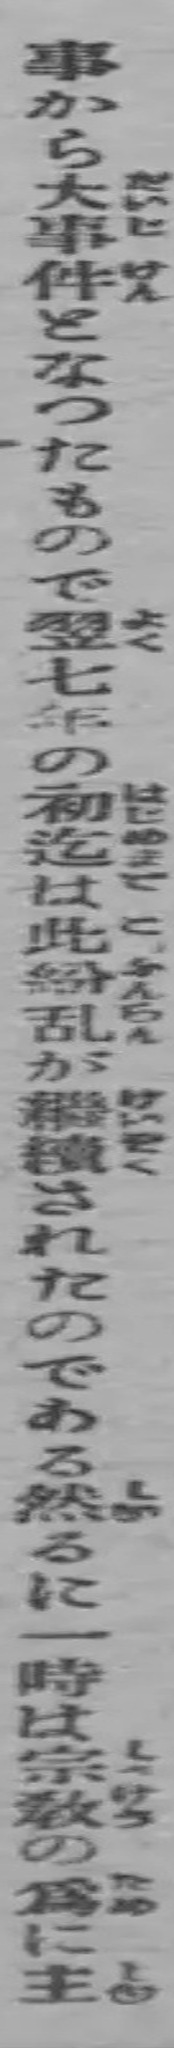事から大事件となつたもので翌七年の初迄は此紛乱が継続されたのである然るに一時は宗教の為に主
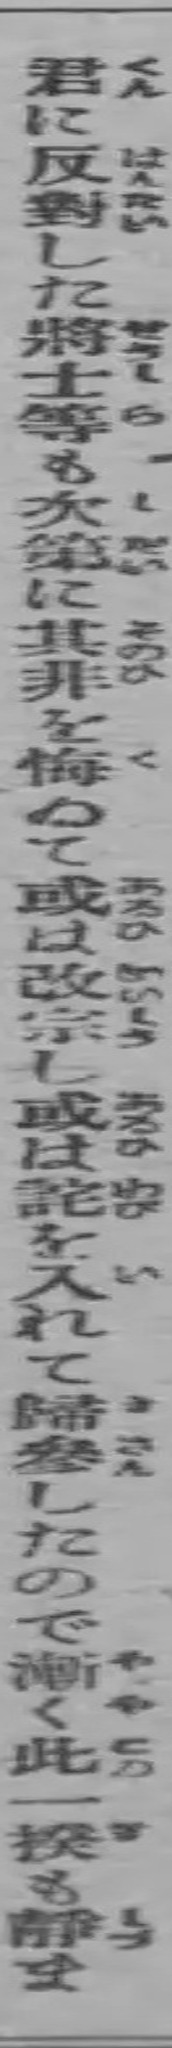君に反対した将士等も次第に其非を悔ゐて或は改宗し或は詫を入れて帰参したので漸く此一揆も静ま
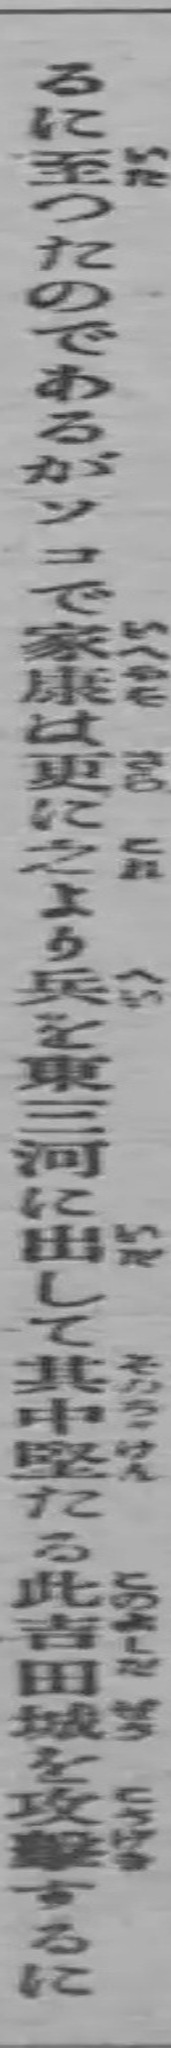るに至つたのであるがソコで家康は更に之より兵を東三河に出して其中堅たる此吉田城を攻撃するに
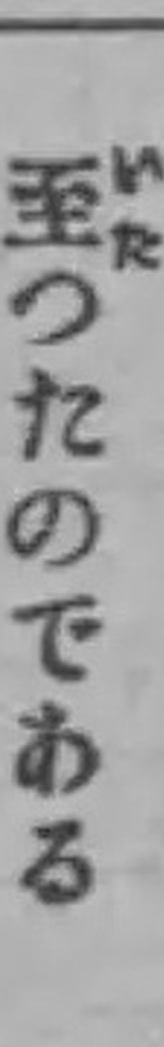至つたのである
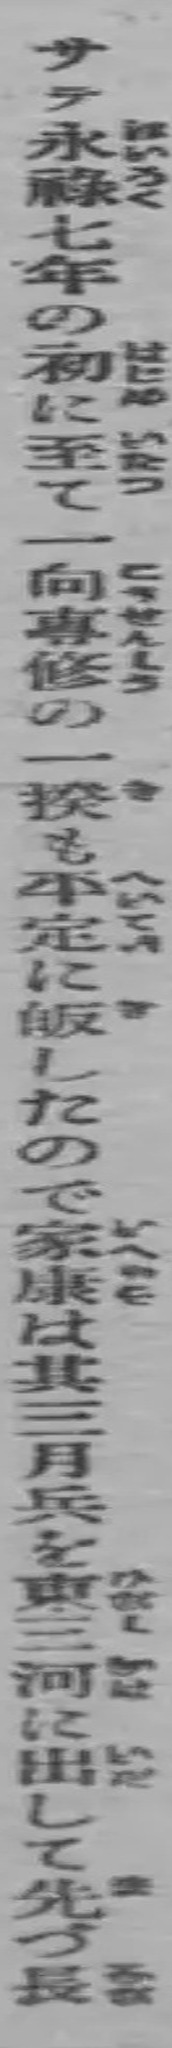サテ永禄七年の初に至て一向専修の一揆も平定に皈したので家康は其三月兵を東三河に出して先づ長
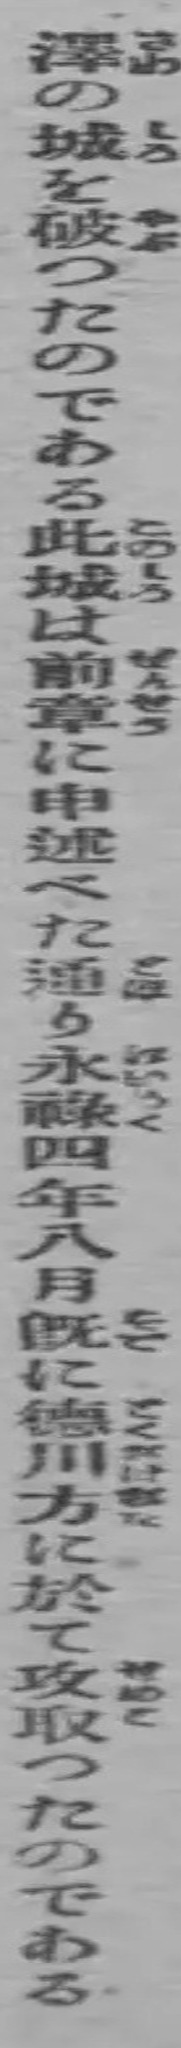沢の城を破つたのである此城は前章に申述べた通り永禄四年八月既に徳川方に於て攻取つたのである
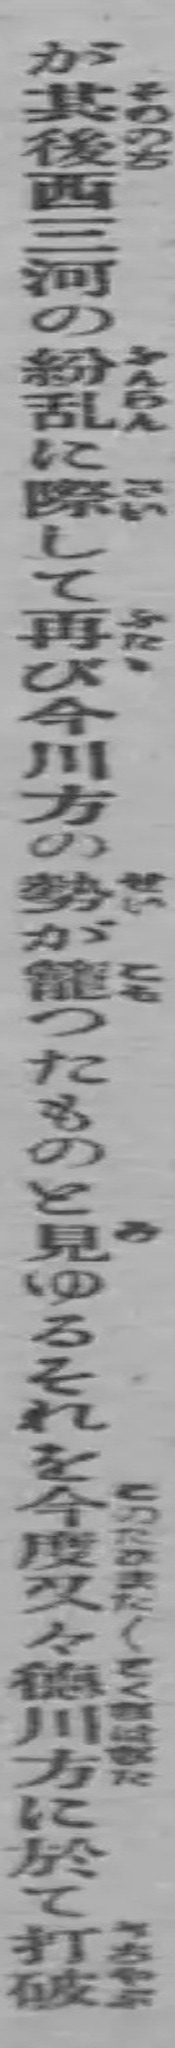が其後西三河の紛乱に際して再び今川方の勢が籠つたものと見ゆるそれを今度又々徳川方に於て打破
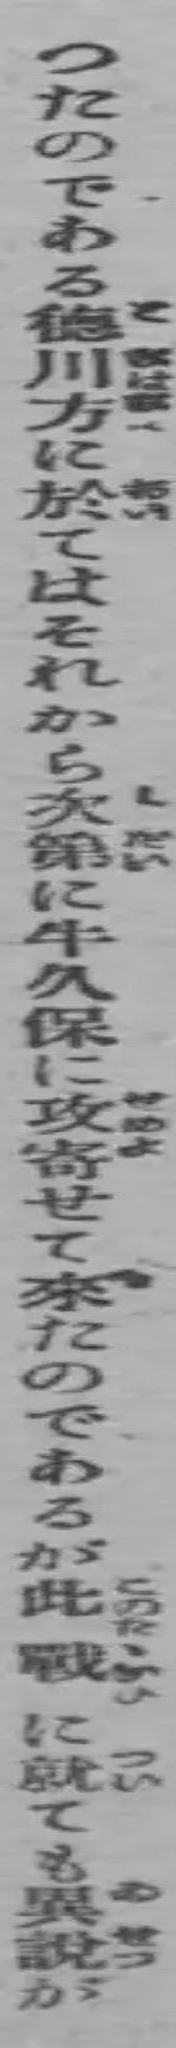つたのである徳川方に於てはそれから次第に牛久保に攻寄せて来たのであるが此戦に就ても異説が
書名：豊橋市史談
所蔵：国立国会図書館 National Diet Library, JAPAN
